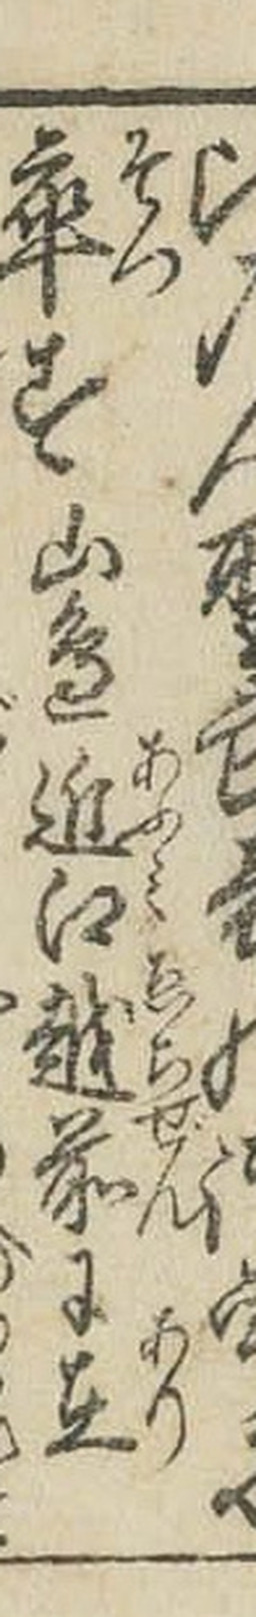卒す山辺近江越前に在
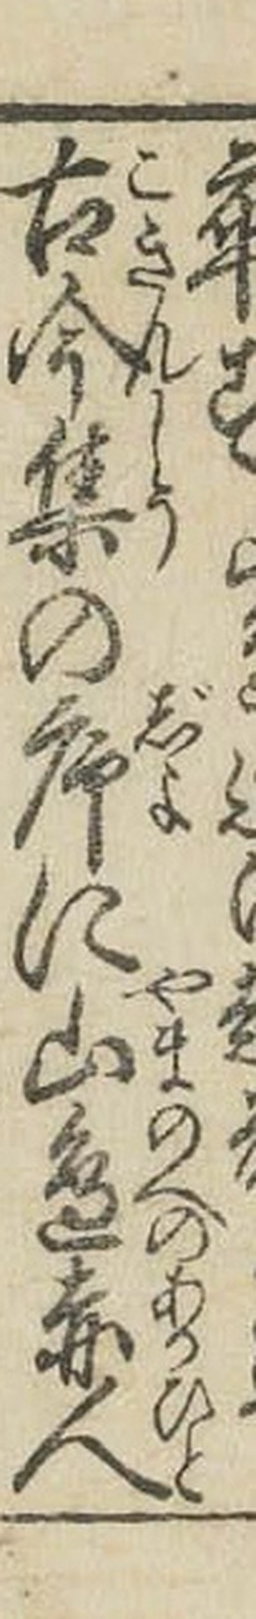古今集の序に山辺赤人
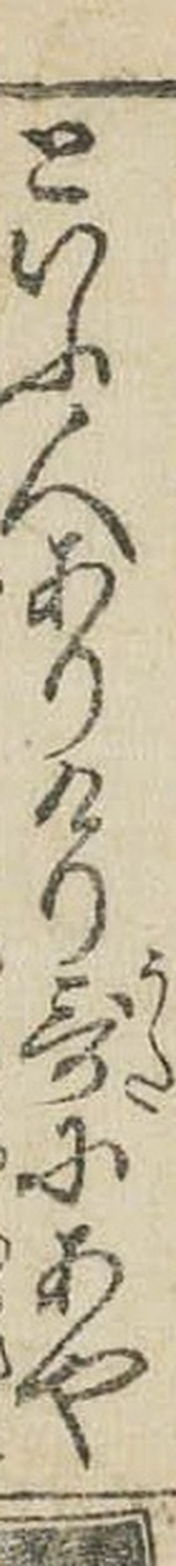といふ人ありけり哥にあや
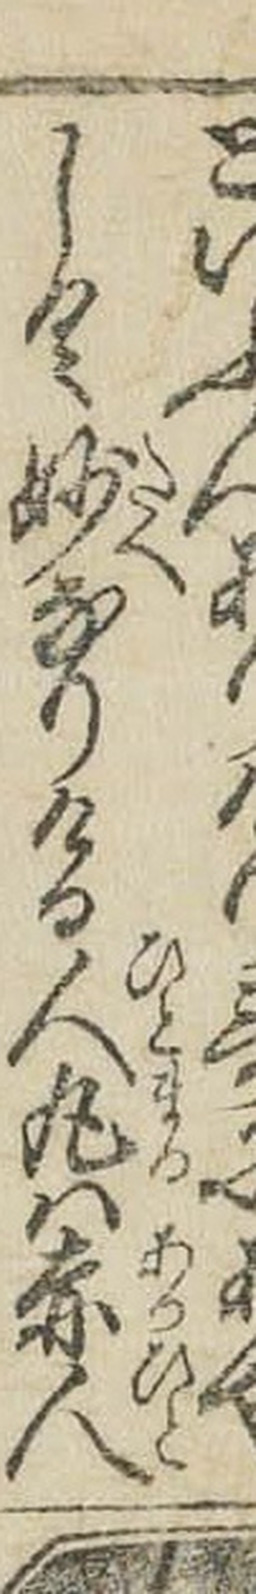しく妙なりける人丸は赤人
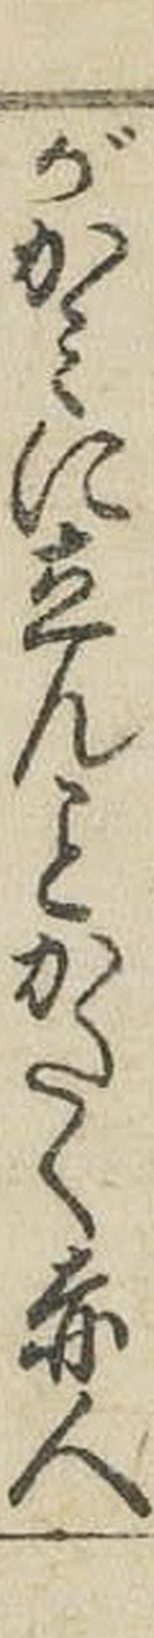がかみに立んことかたく赤人
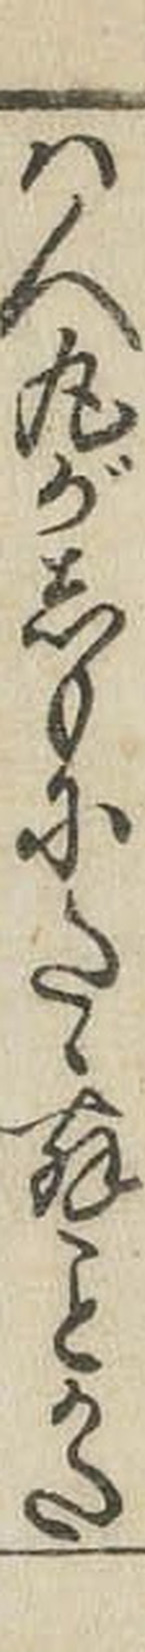は人丸がしもにたゝむことかた
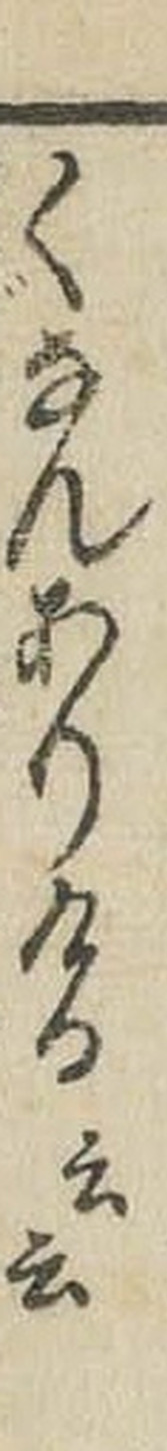くなんありける云云
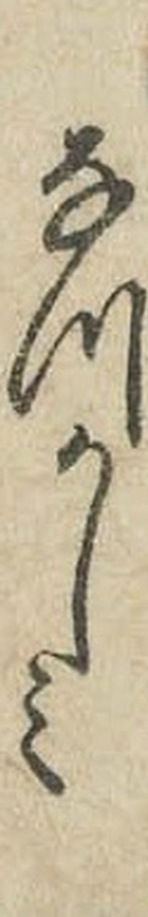なつかしみ
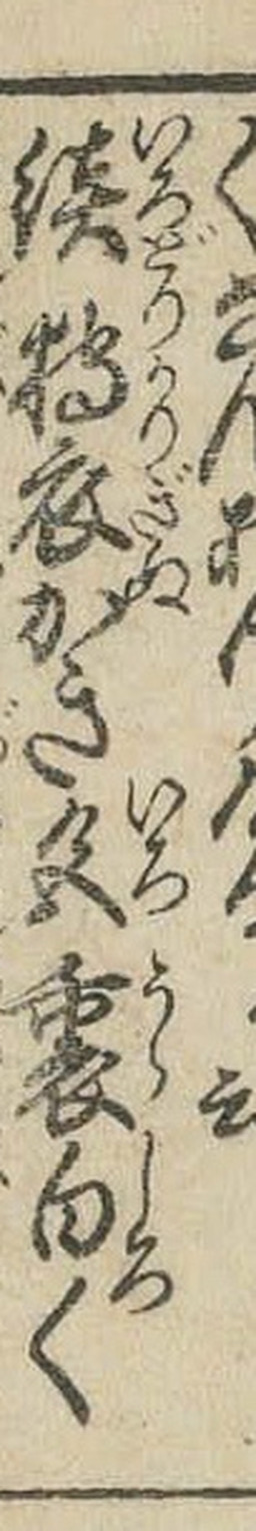綾狩衣かき色裏白く
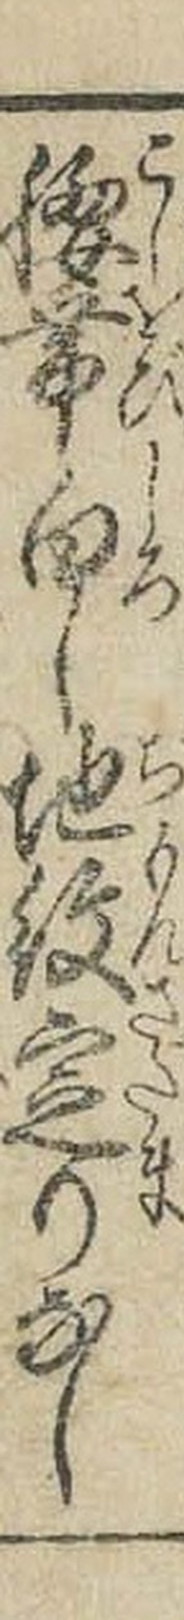腰帯白し地紋定りなし
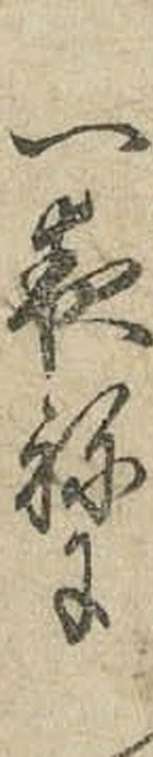一夜ねに
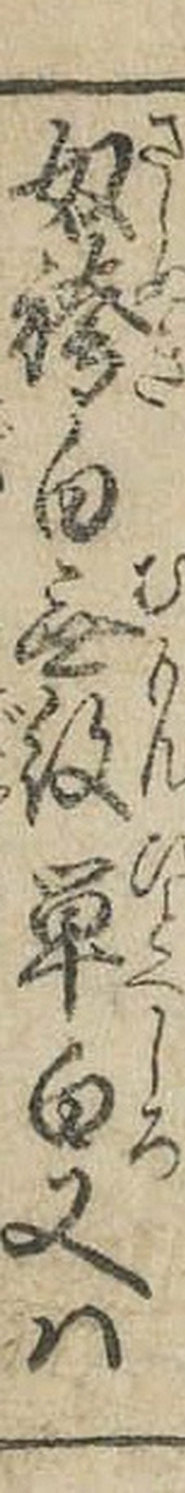奴袴白無紋単白又は
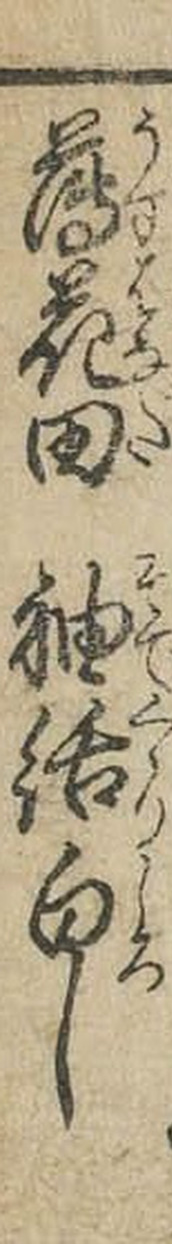薄花田袖結白し

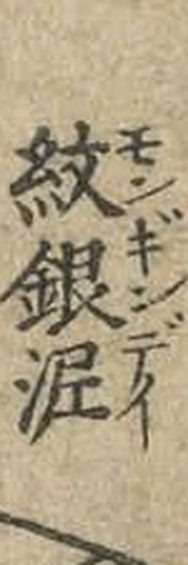紋銀泥
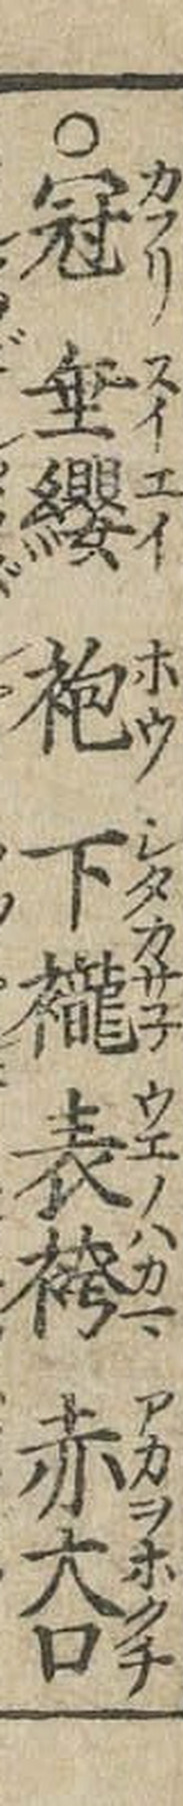○冠垂纓袍下襲表袴赤大口
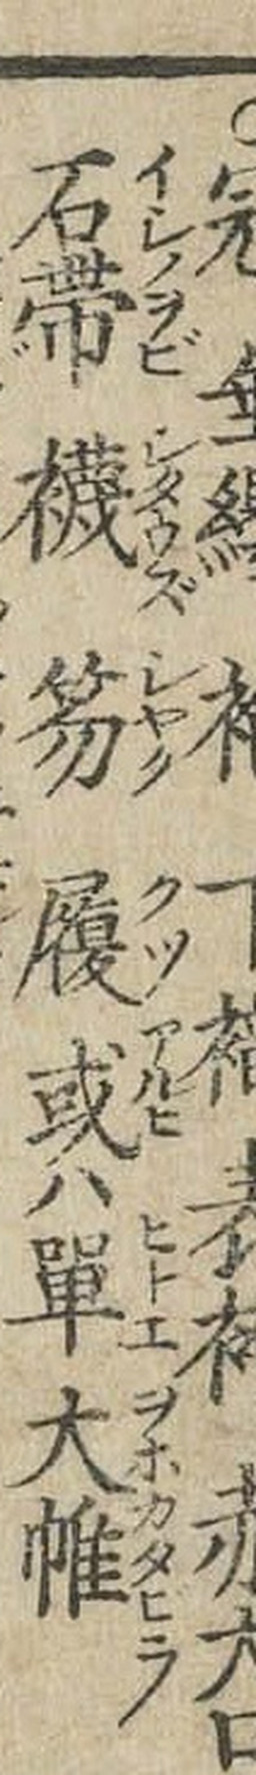石帯襪笏履或ハ単大帷
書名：絵本写宝袋 9巻 1之巻
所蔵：東京学芸大学教育コンテンツアーカイブ
